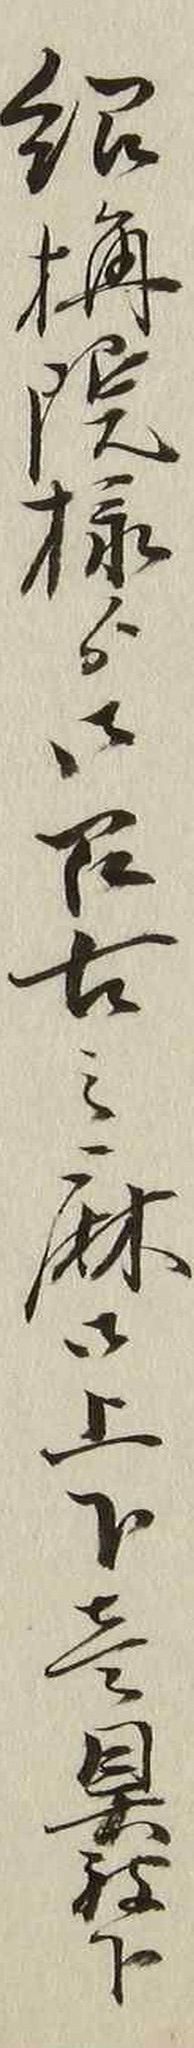紹栴院様ゟ御召古之麻御上下壱具被下
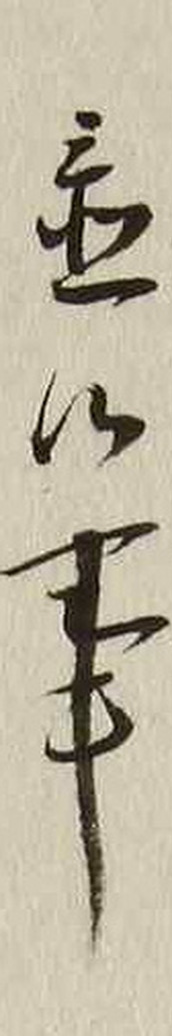置候事
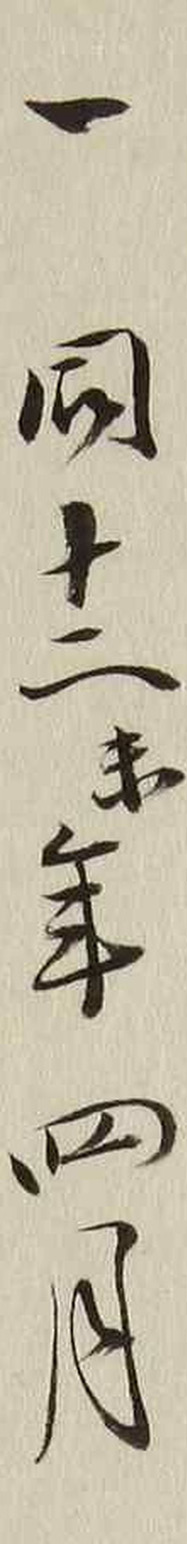一同十二未年四月
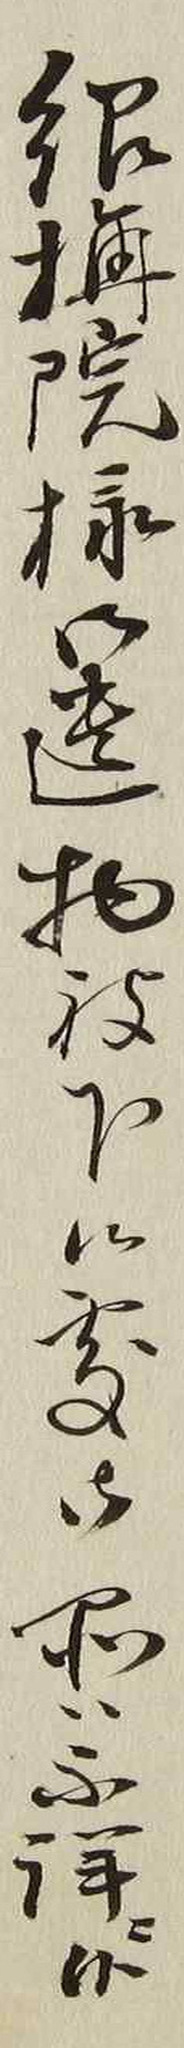紹栴院様御遺物被下候処御品は不詳ニ候
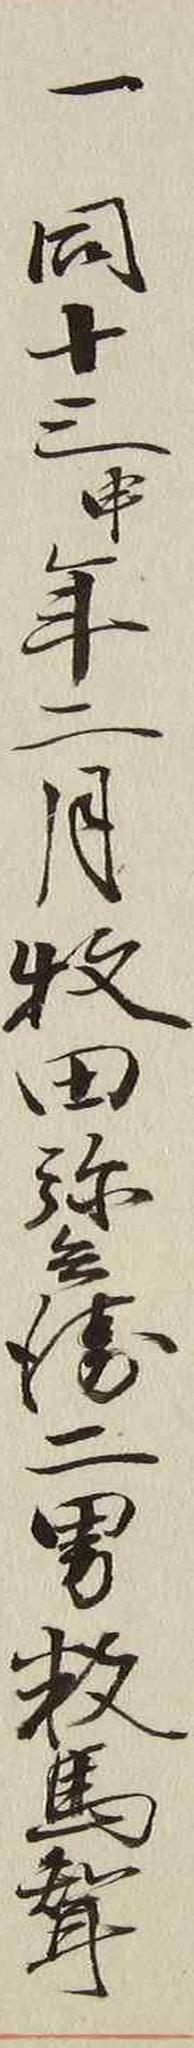一同十三申年二月牧田弥兵衛二男数馬婿
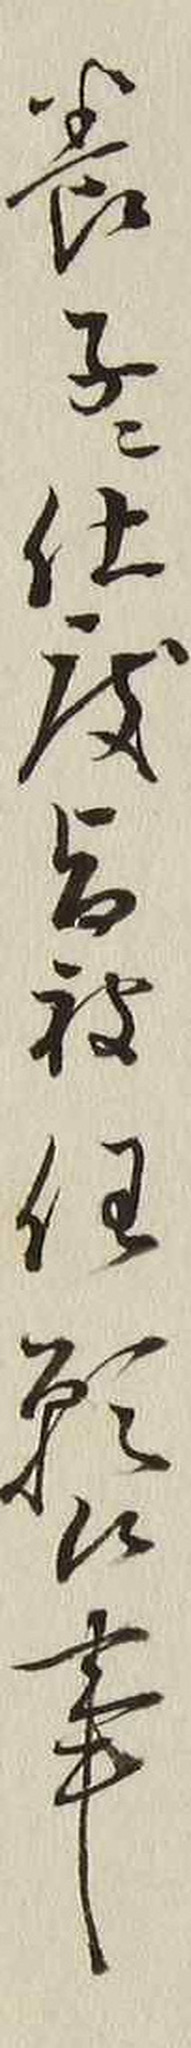養子ニ仕度旨被任願候事
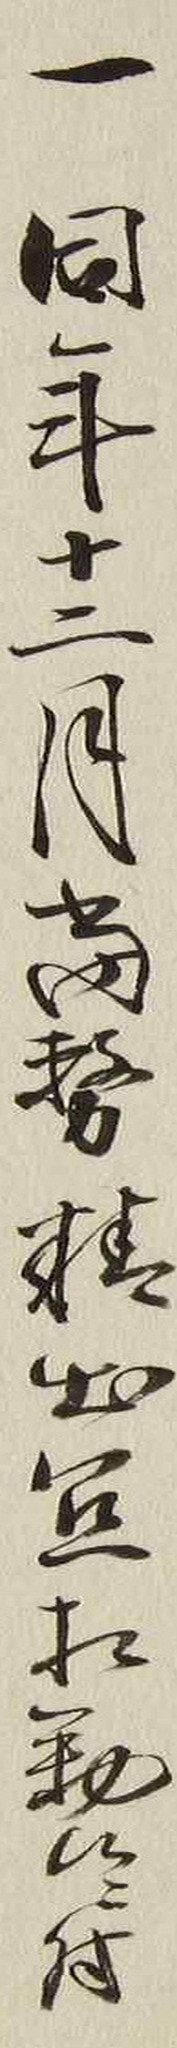一同年十二月当務精出宜相勤候ニ付
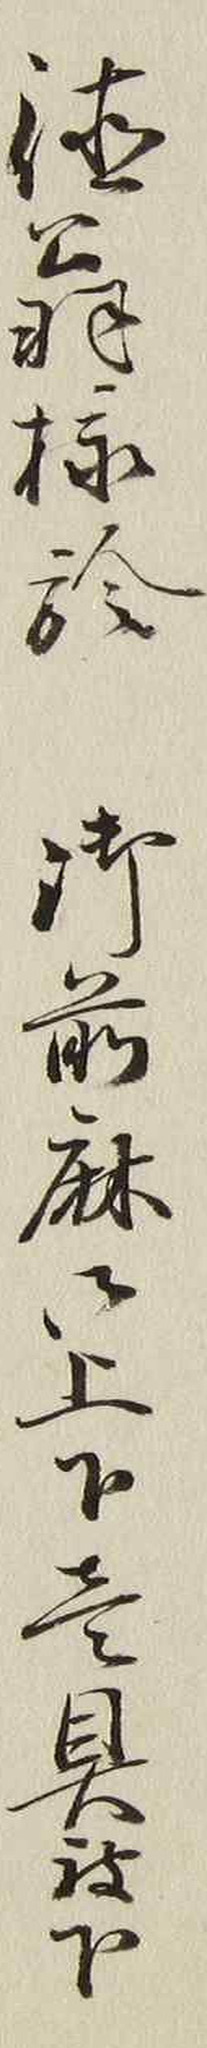徳翁様於御前麻御上下壱具被下
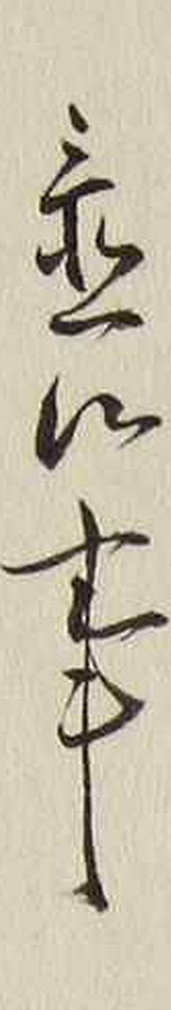置候事
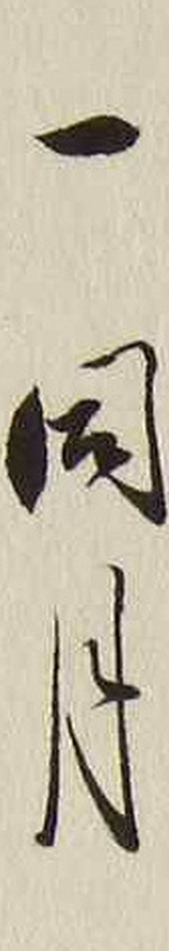一同月
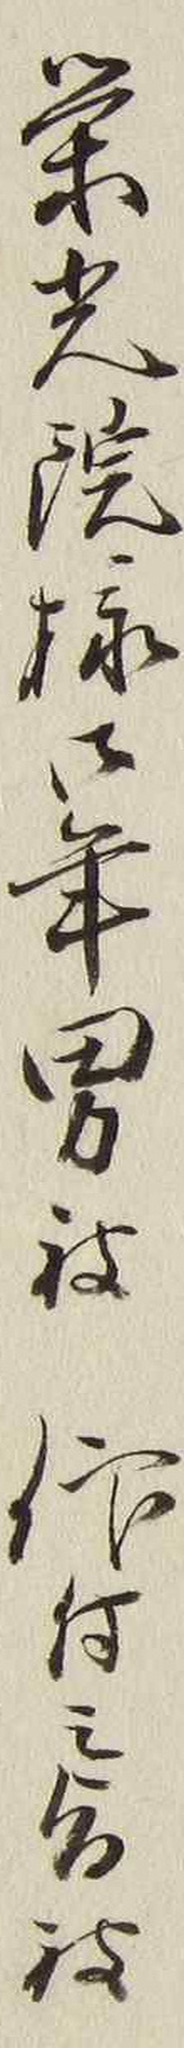栄光院様御年男被仰付之旨被
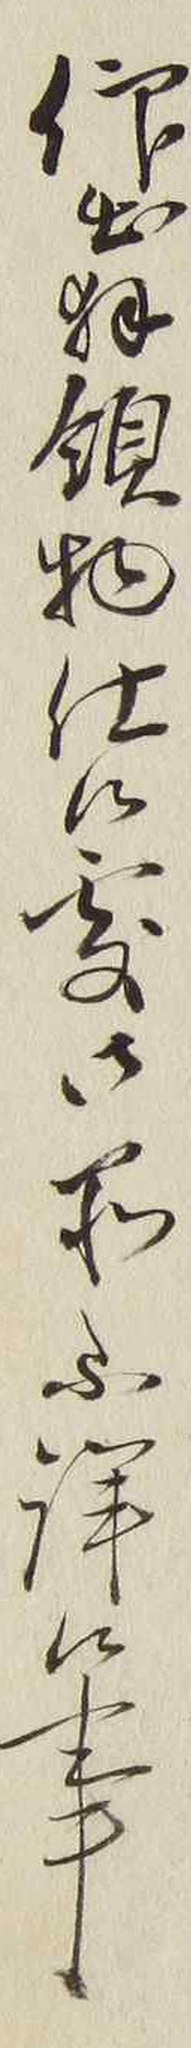仰出拝領物仕候処御品不詳候事

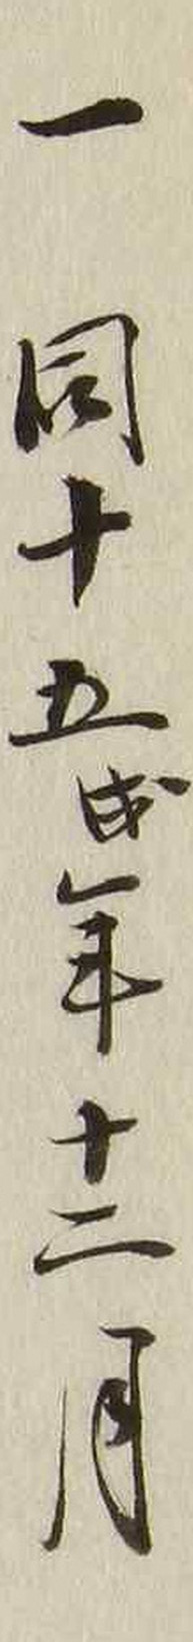一同十五戌年十二月
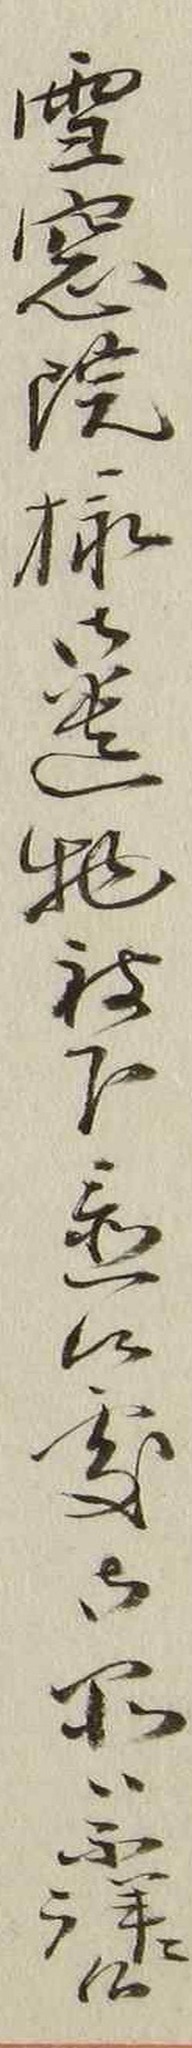雪窓院様御遺物被下置候処御品は不詳ニ候
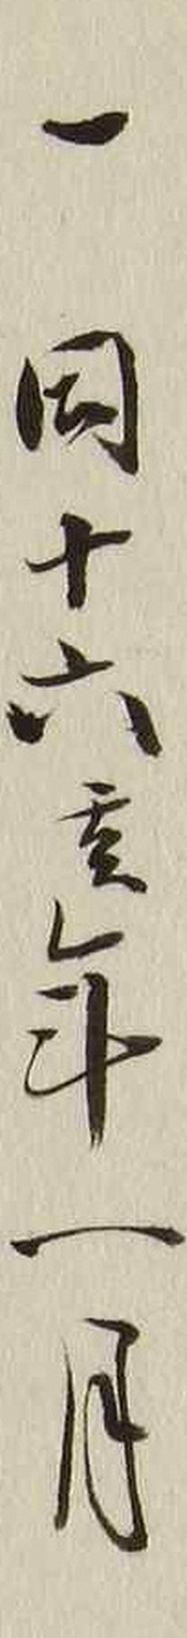一同十六亥年一月
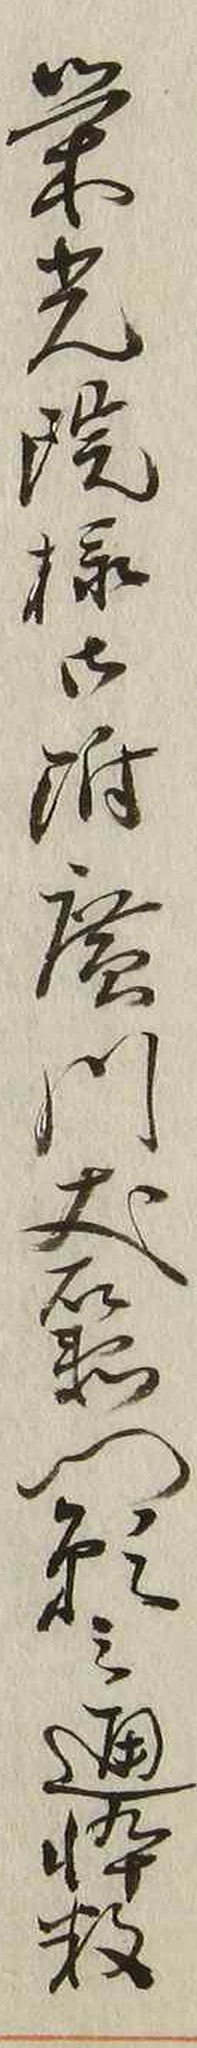栄光院様御附広川丈右衛門願之通忰数
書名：諸士系譜　巻之163　な之部5
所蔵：会津若松市立会津図書館
